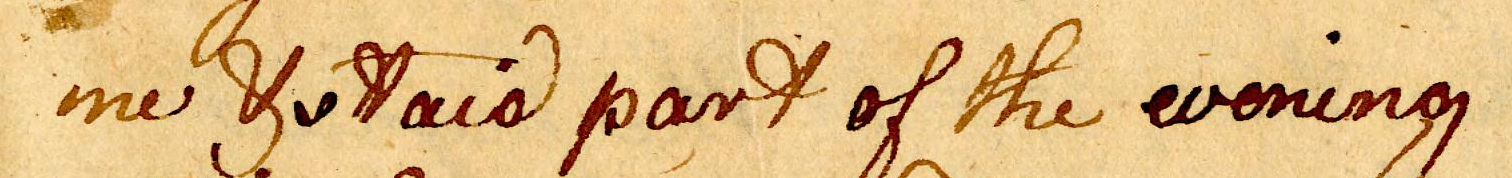me & staid part of the evening
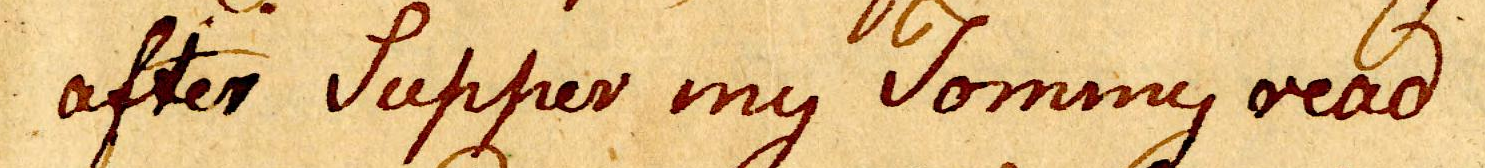after Supper my Tommy read
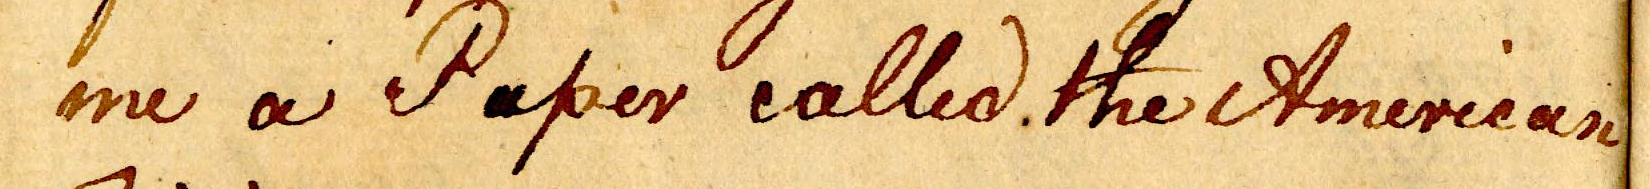me a Paper called the American
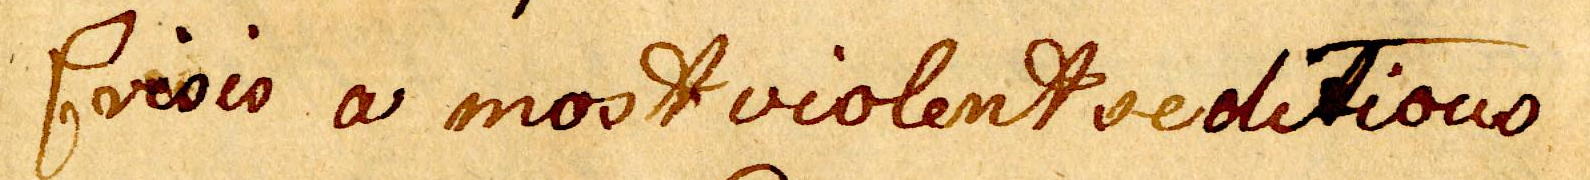Crisis a most violent seditious
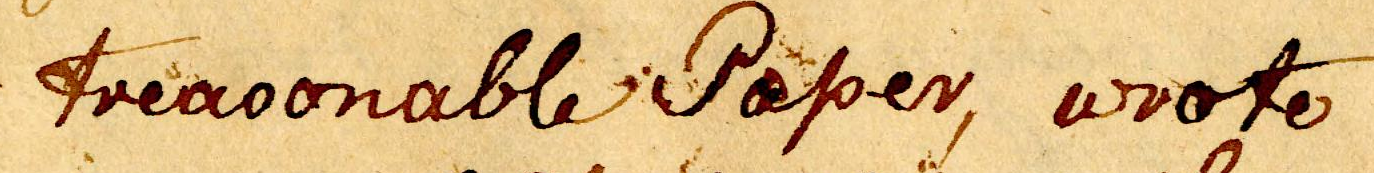treasonable Paper, wrote
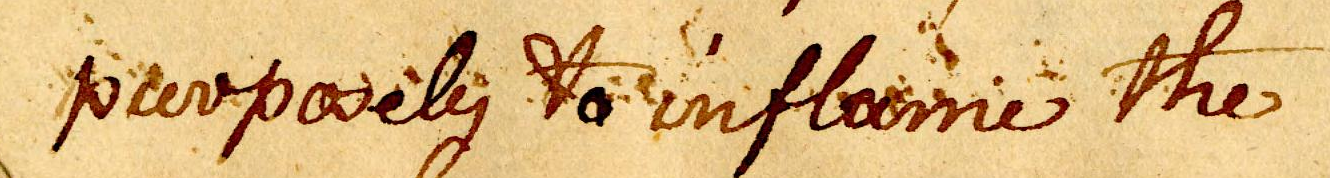purposely to inflame the
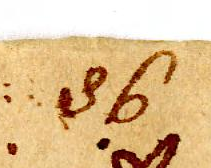36
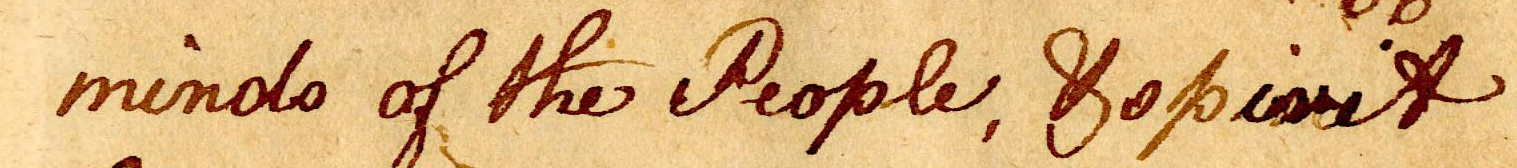minds of the People, & spirit
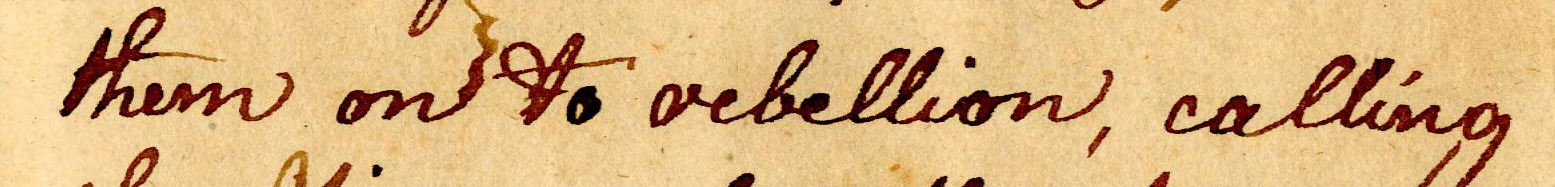them on to rebellion, calling
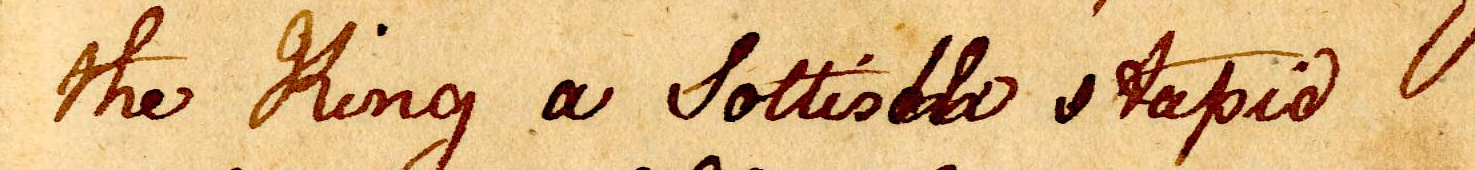the King a Sottisll stupid
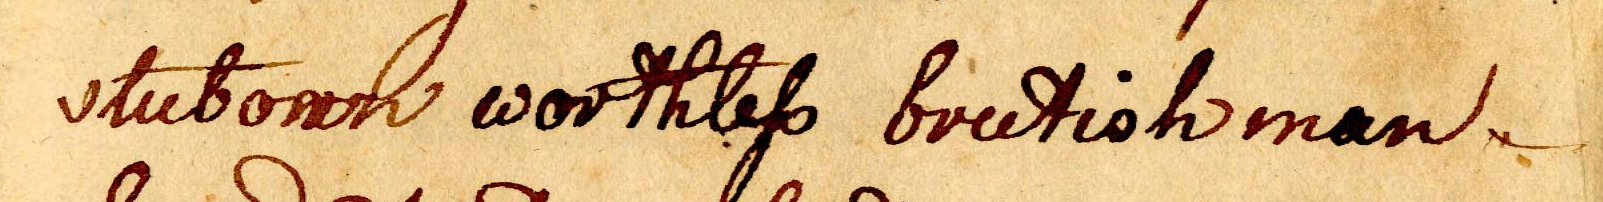stubborn worthless brutish man -
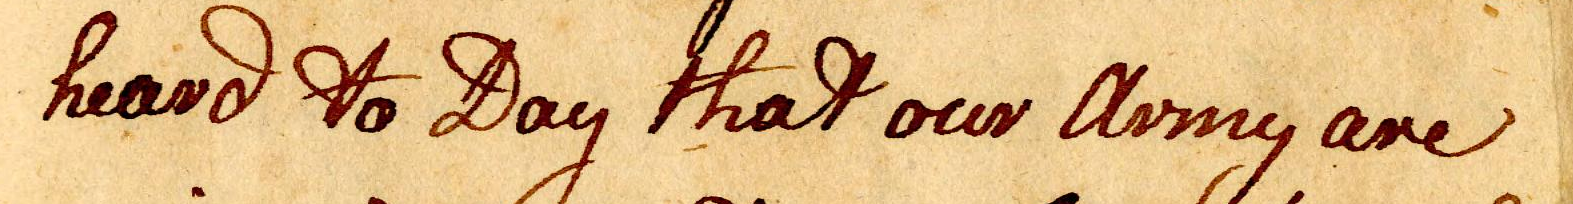heard to Day that our Army are
